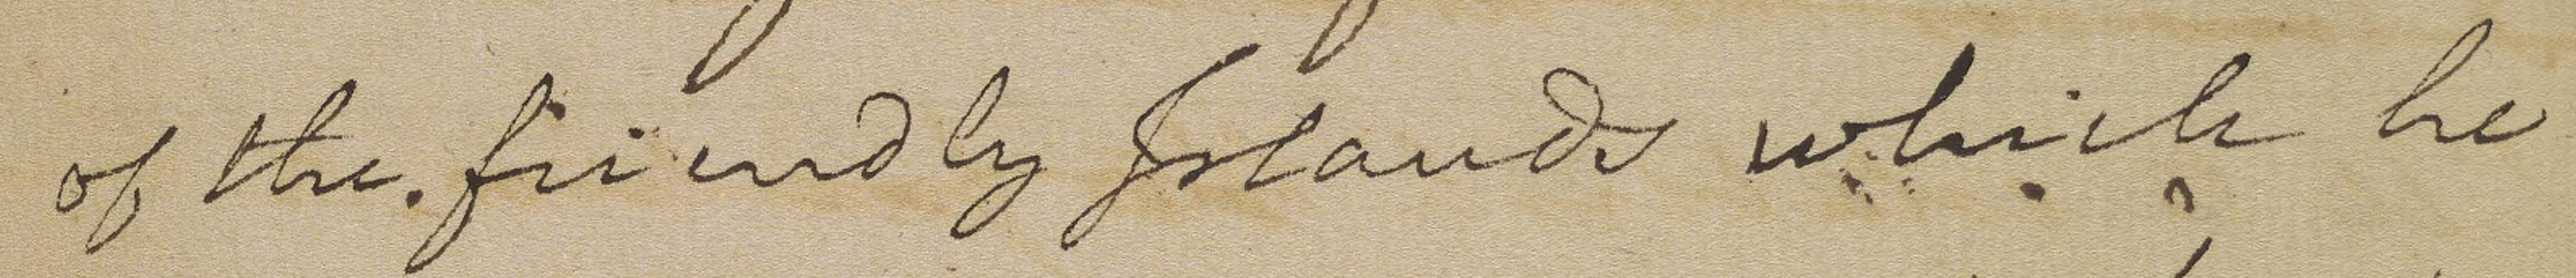of the friendly Islands which he
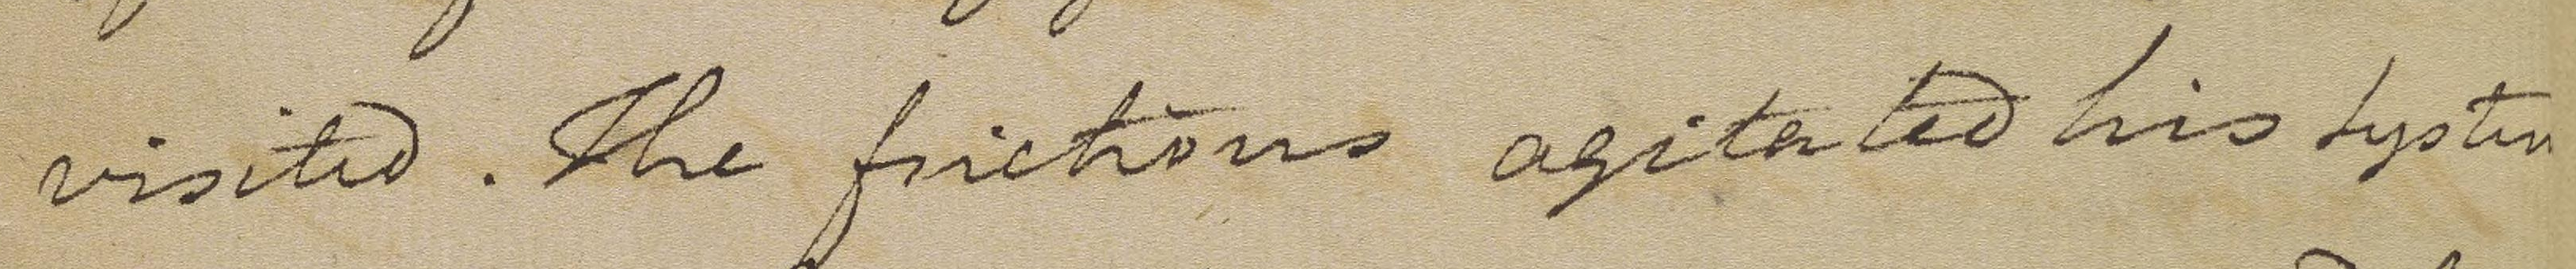visited. The frictions agitated his System
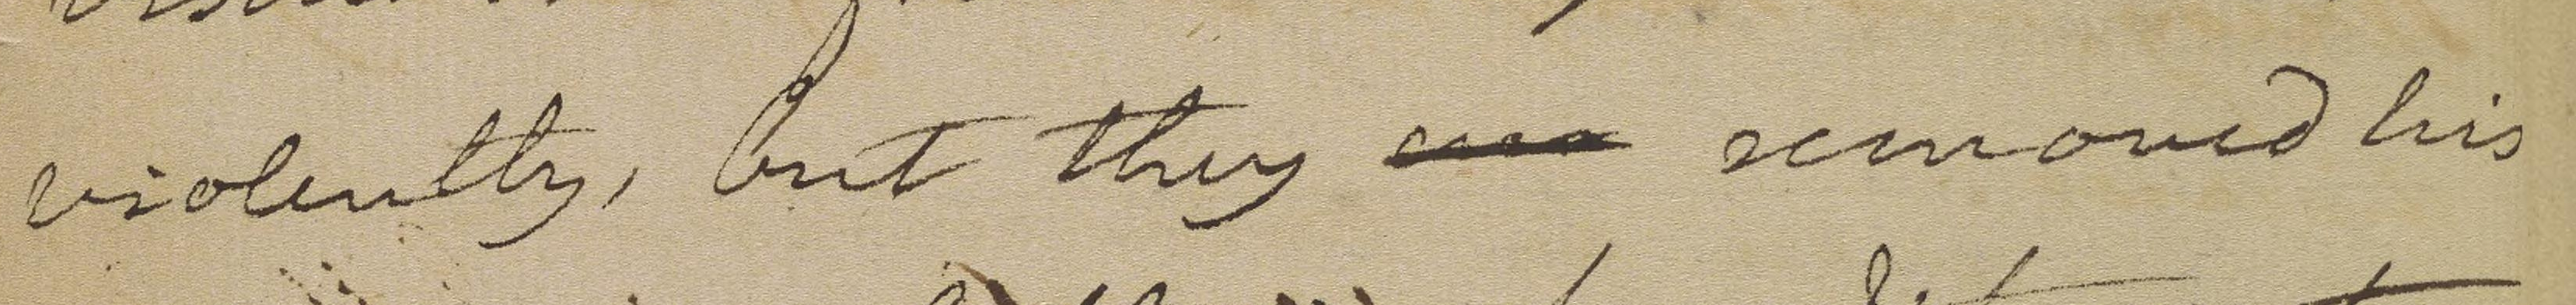violently, but they [are] seasoned his
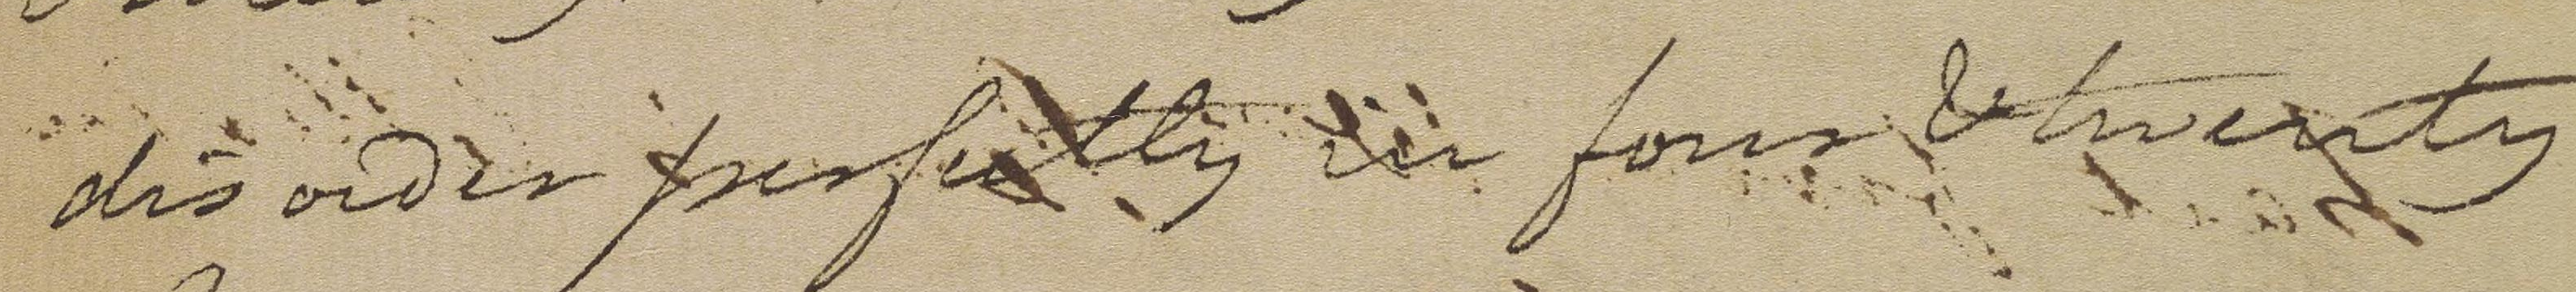disorder perfectly in four & twenty
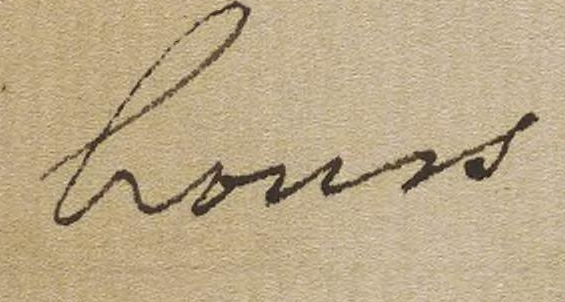hours.
